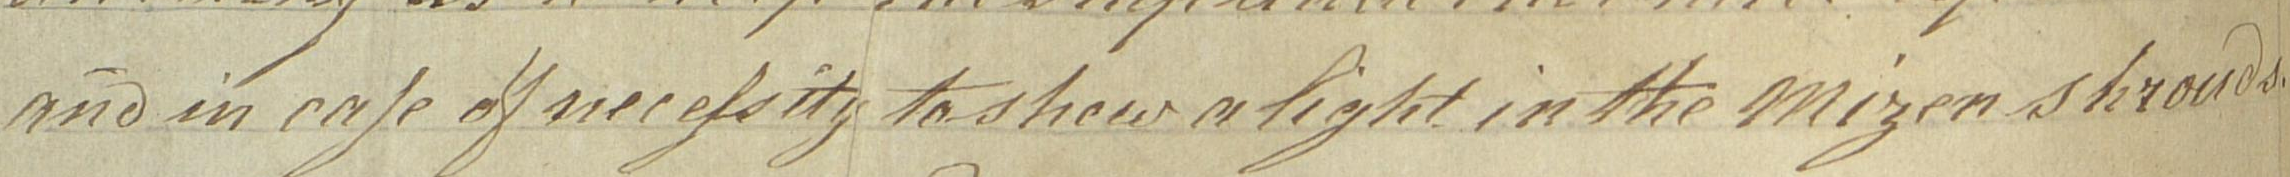and in case of necessity to show a Light in the mizen shrouds
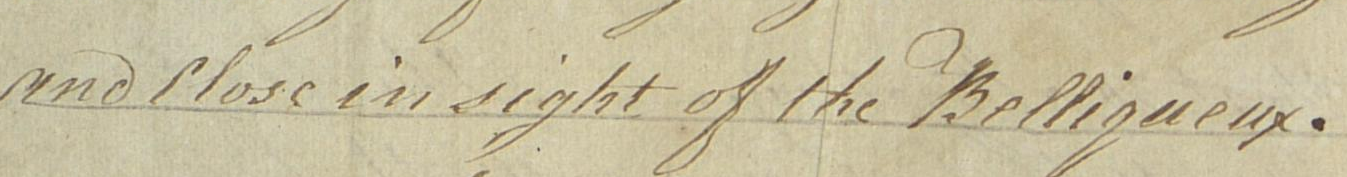and Close in sight of the Belliqueux.
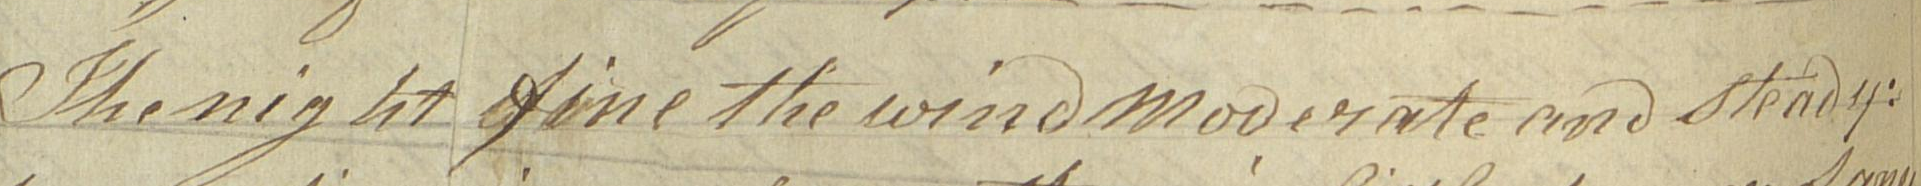The night fine the wind Moderate and Steady:
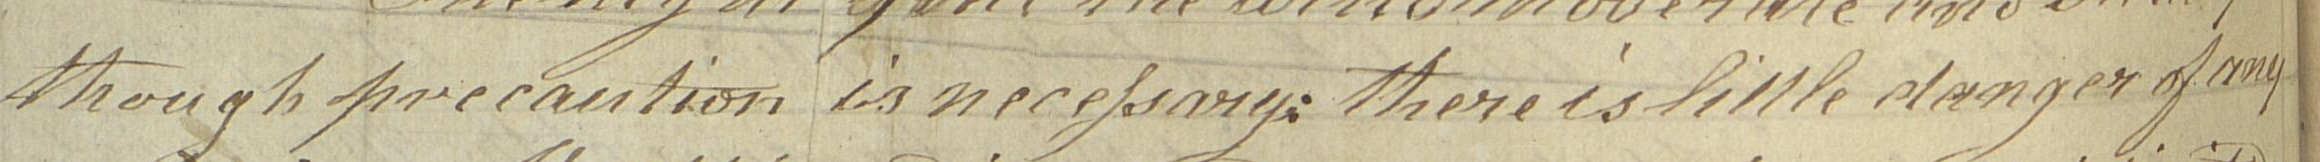though precaution is necessary: there is little danger of any
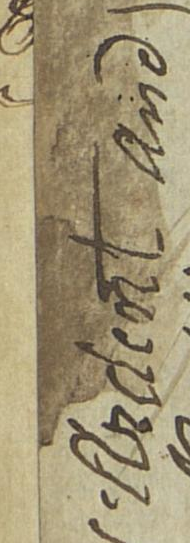(Ardent And
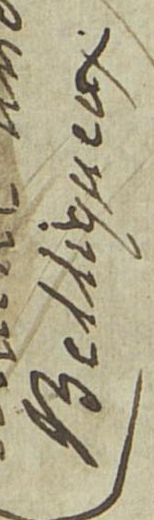Belliqueux)
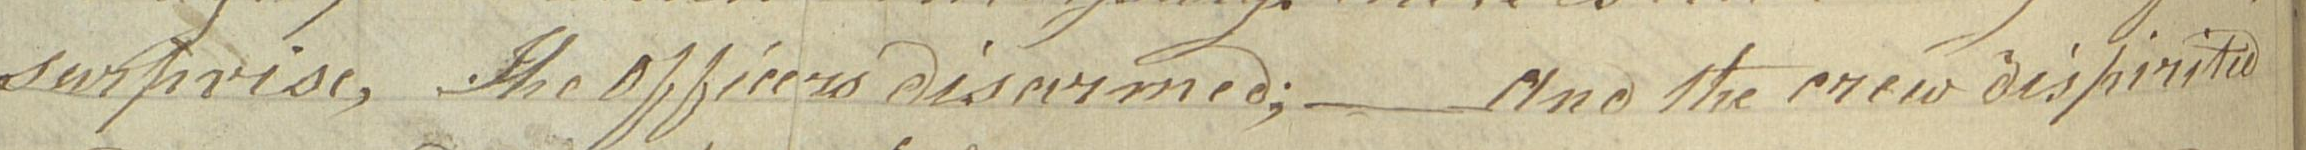surprise, The Officers disarmed; And the crew dispirited
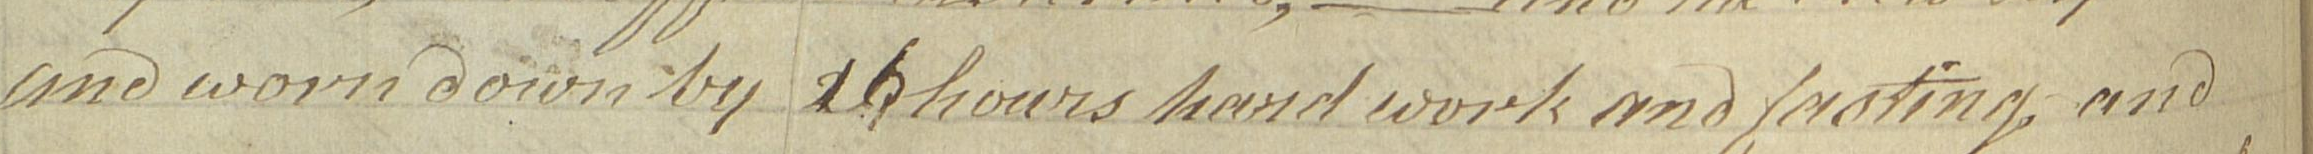and worndown by 16 hours hard work and fasting, and
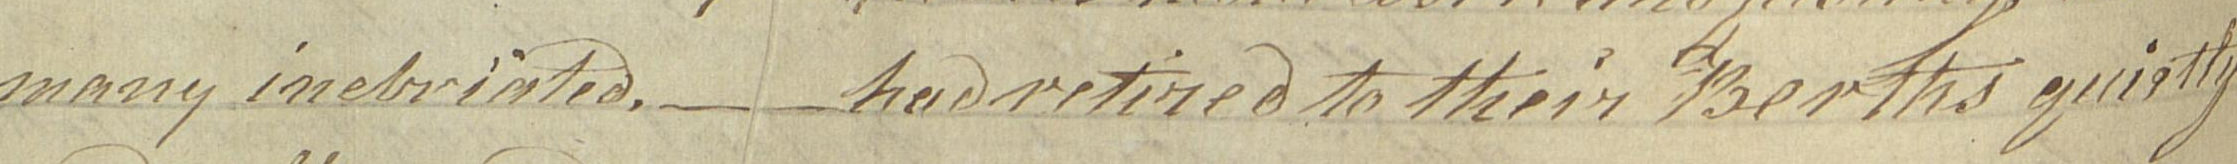many inebriated. had retired to their Berths quietly
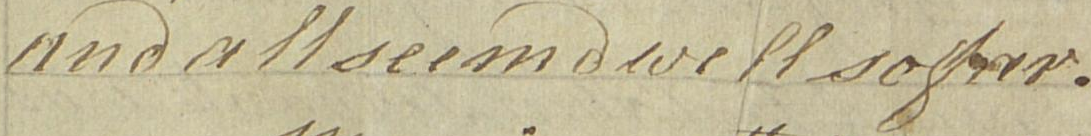and all seemd well so far.
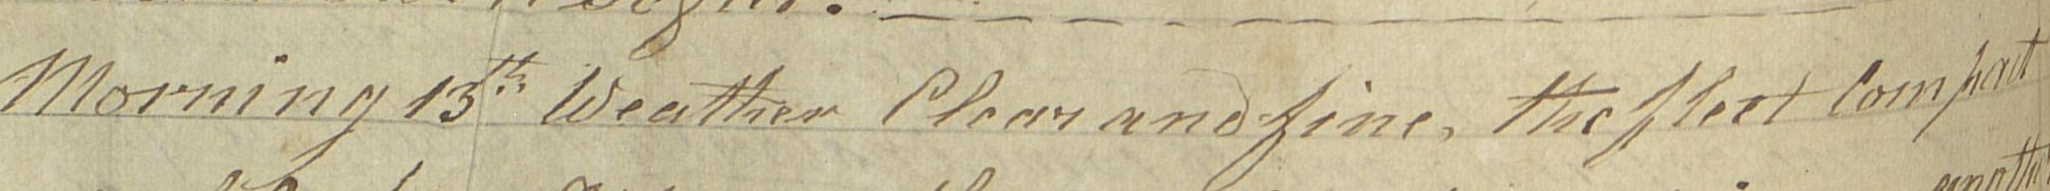Morning 13^th. Weather Clear and fine. the fleet Compact
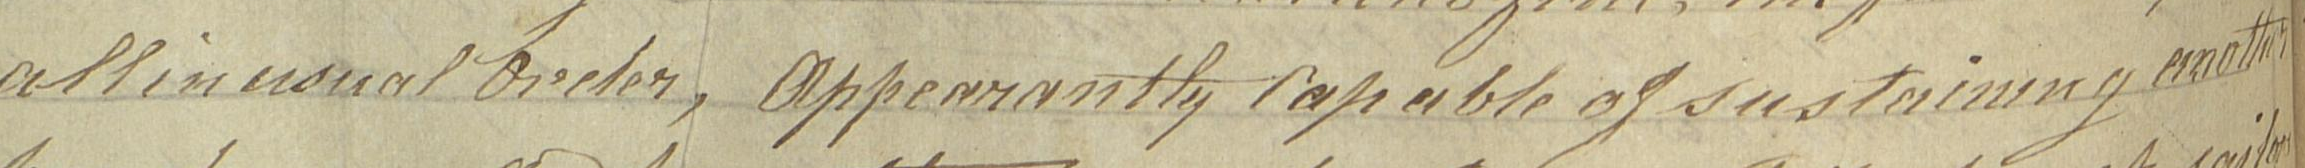all in usual Order, Appearantly Capable of sustaining another
